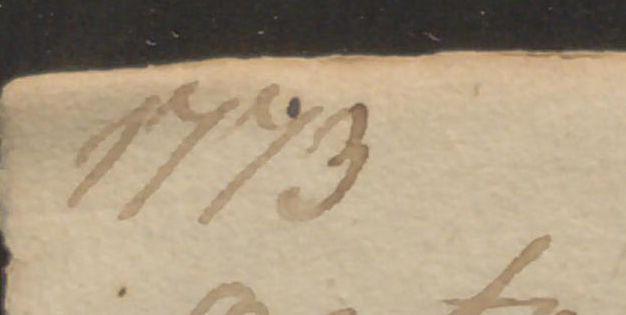1773
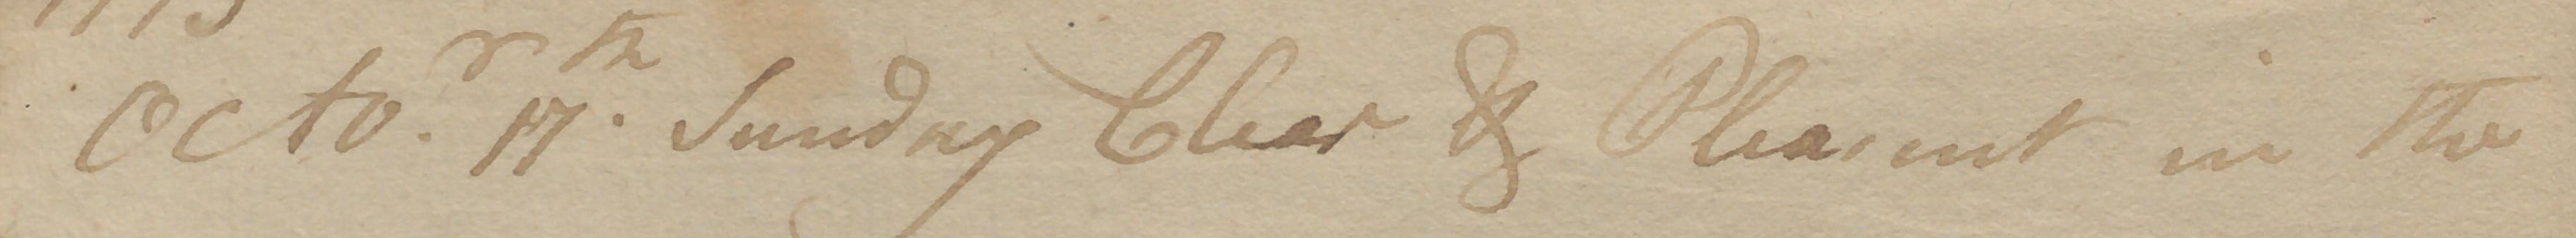Octo^r. 17^th. Sunday Clear & Pleasent in the
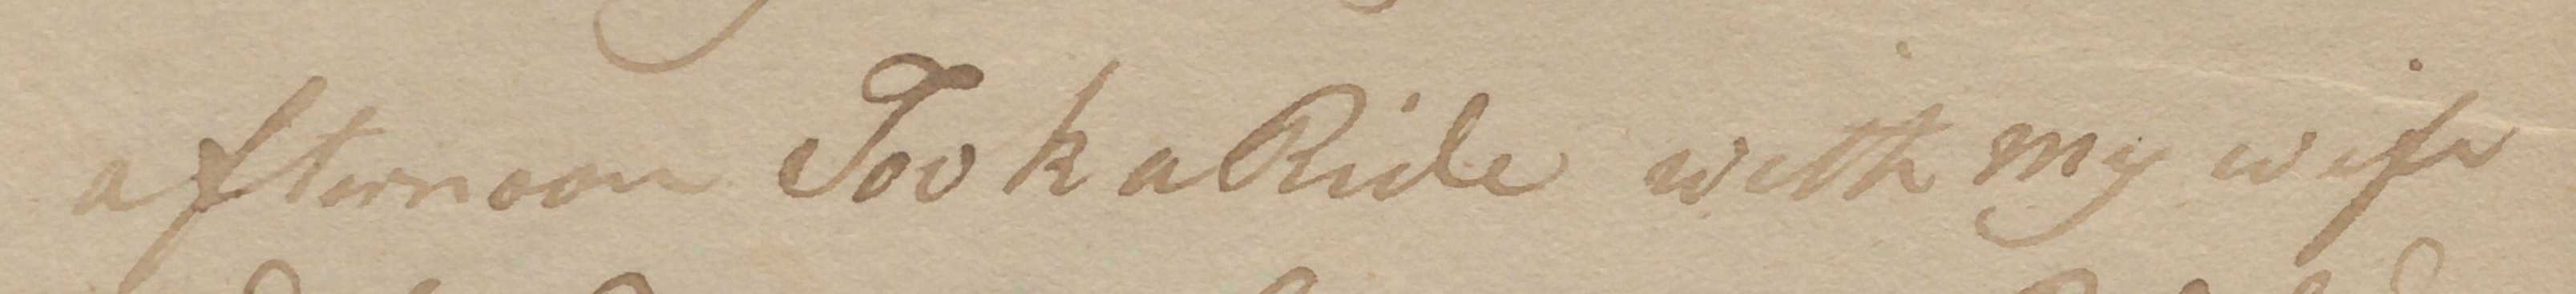afternoon Took a Ride with my wife
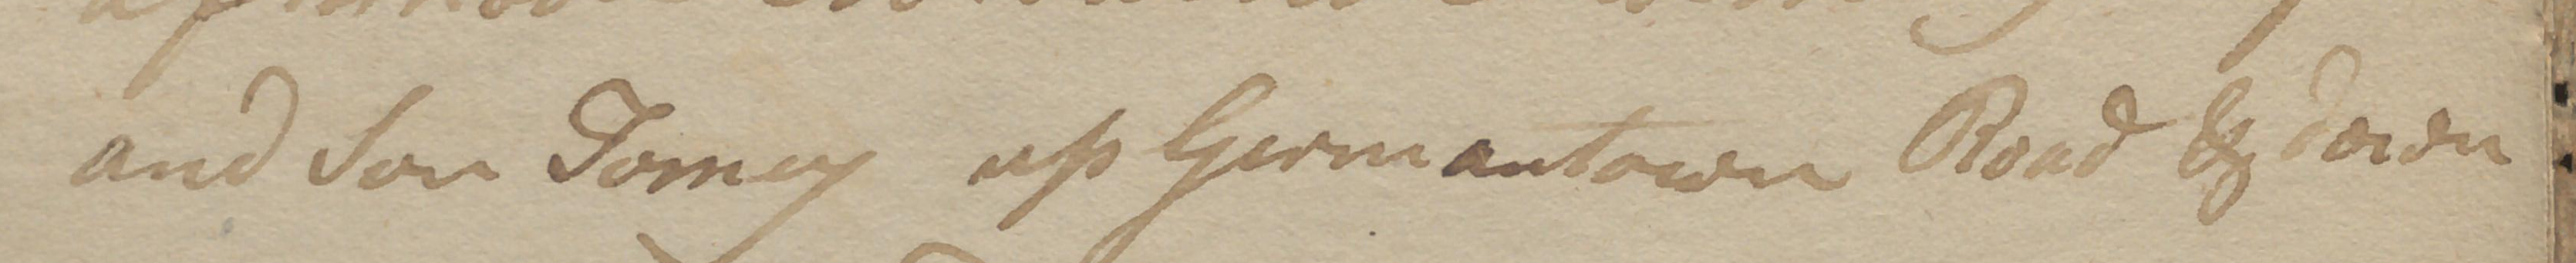and Son Tomey up Germantown Road & down
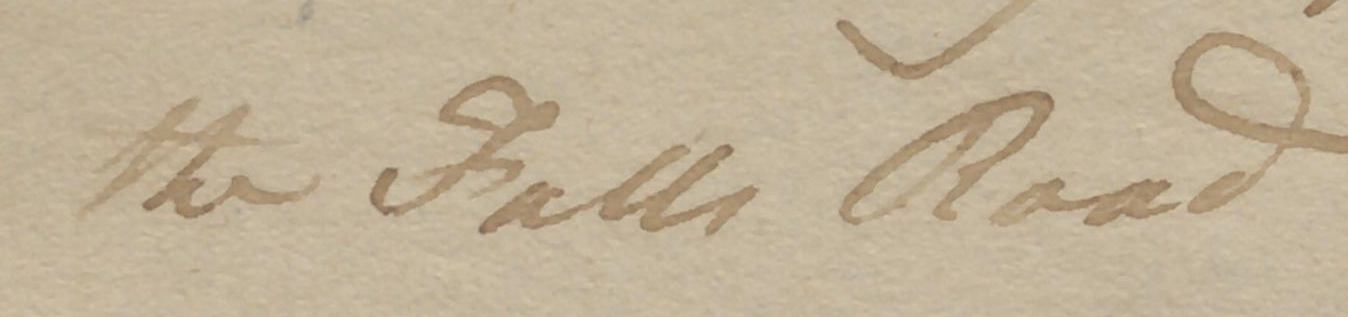the Falls Road
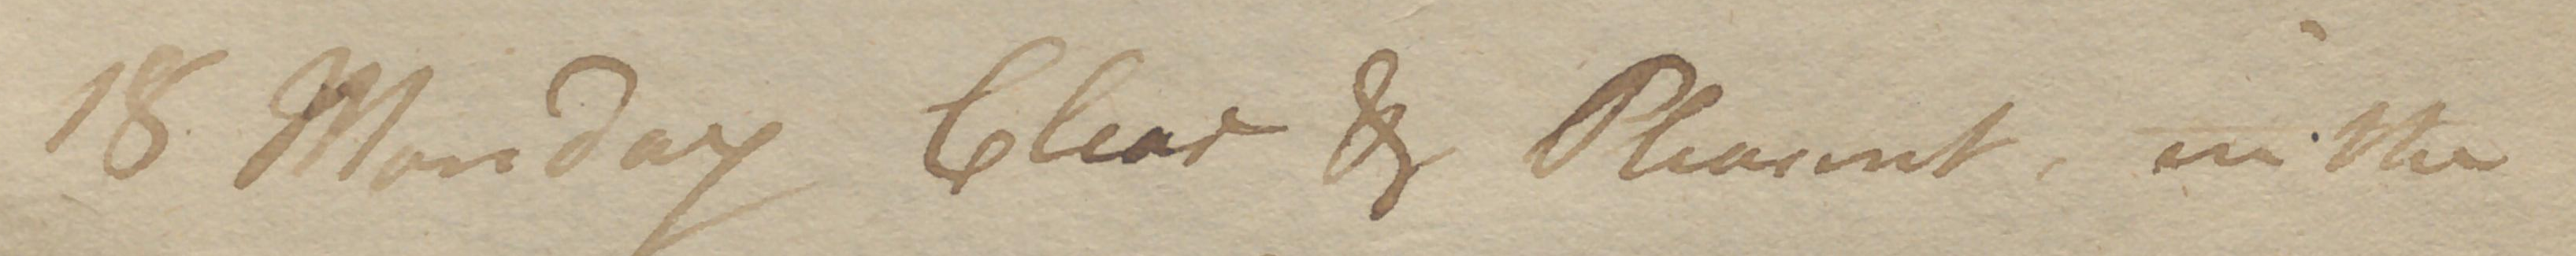18 Monday Clear & Pleasent, in the
